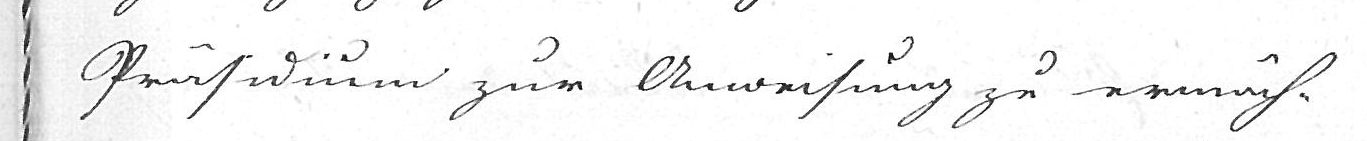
Präsidium zur Anweisung ermäch-
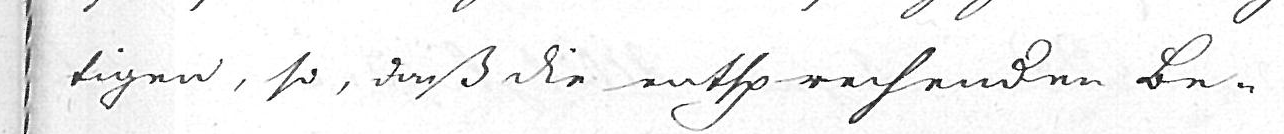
tigen, so, daß die entsprechenden Be-
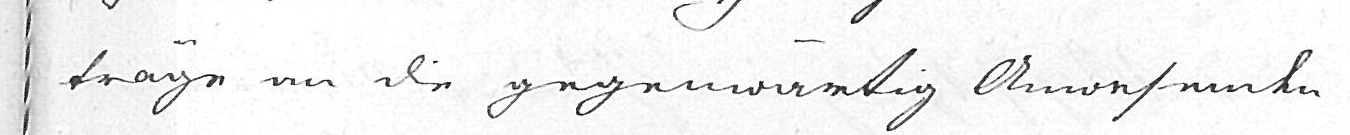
träge an die gegenwärtig Anwesenden
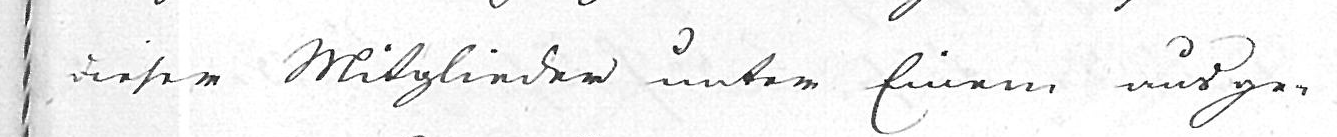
dieser Mitglieder unter Einem ausge-
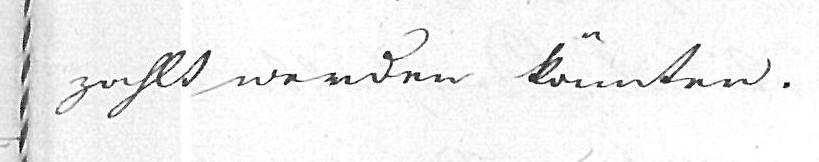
zahlt werden könnten.
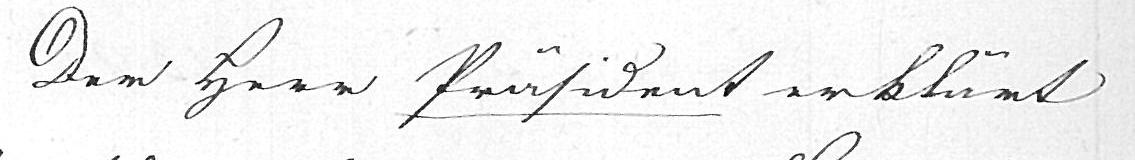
Der Herr Präsident erklärt
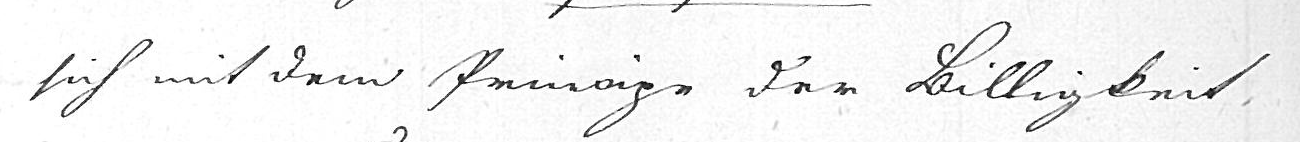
sich mit dem Principe der Billigkeit,
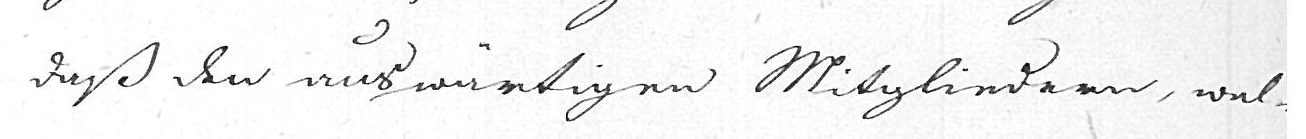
daß den auswärtigen Mitgliedern, wel-
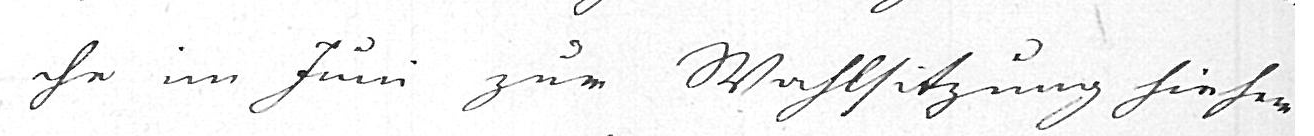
che im Juni zur Wahlsitzung hieher-
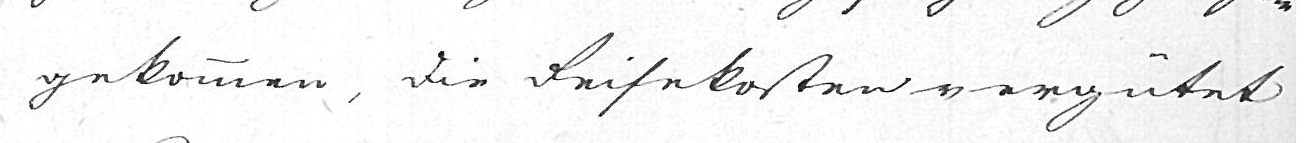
gekommen, die Reisekosten vergütet
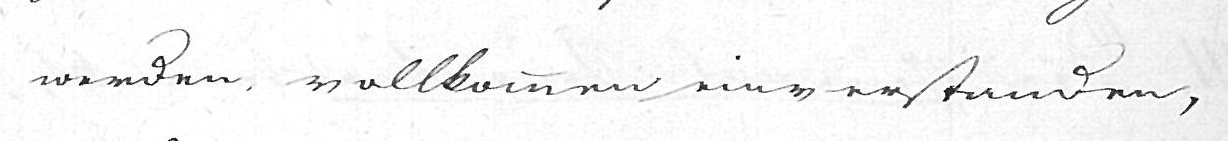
werden, vollkommen einverstanden,
